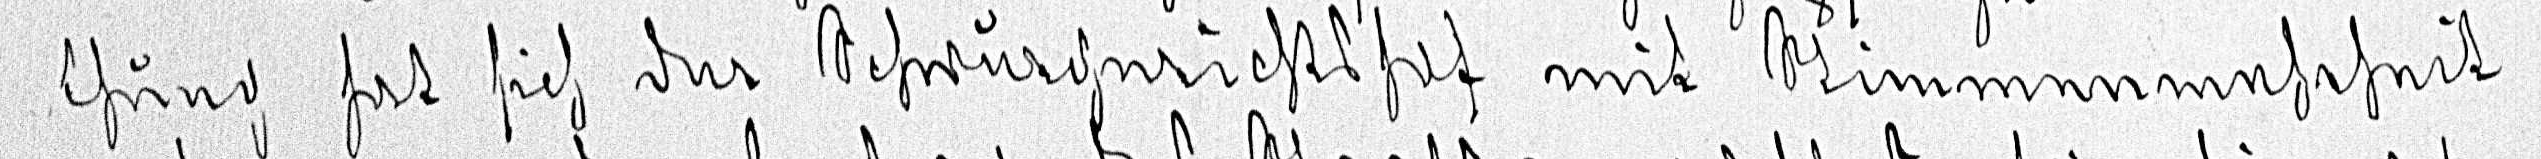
thung hat sich der Schwurgerichtshof mit Stimmenmehrheit
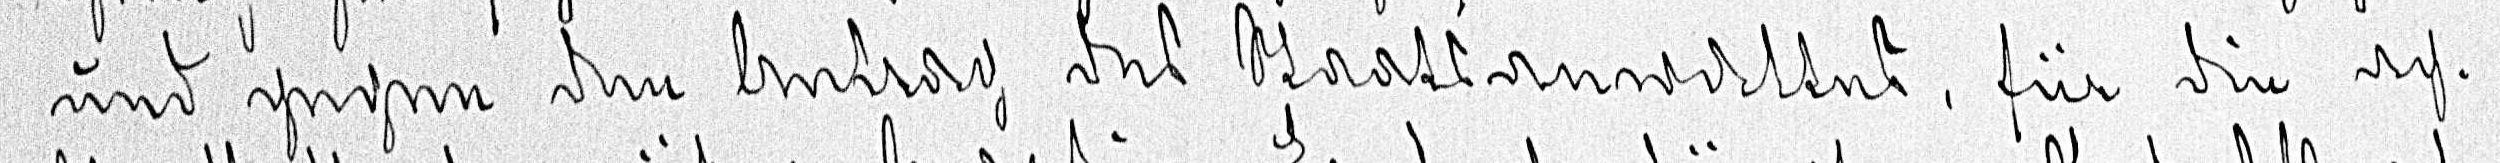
und gegen den Antrag des Staatsanwaltes, für die ag.
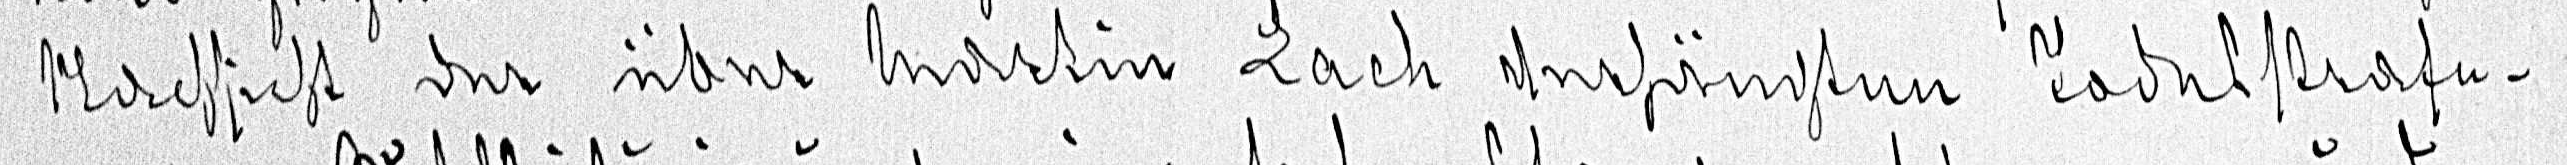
Nachsicht der über Martin Lach verhängten Todesstrafe
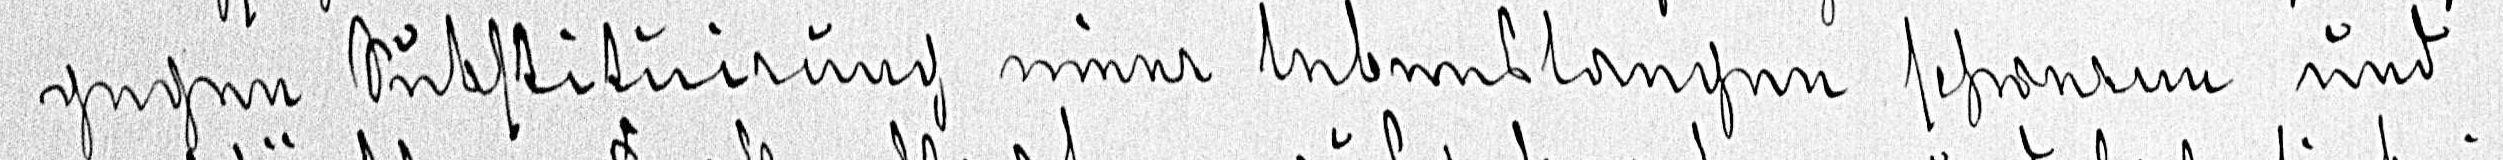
gegen Substituirung einer lebenslangen schweren und
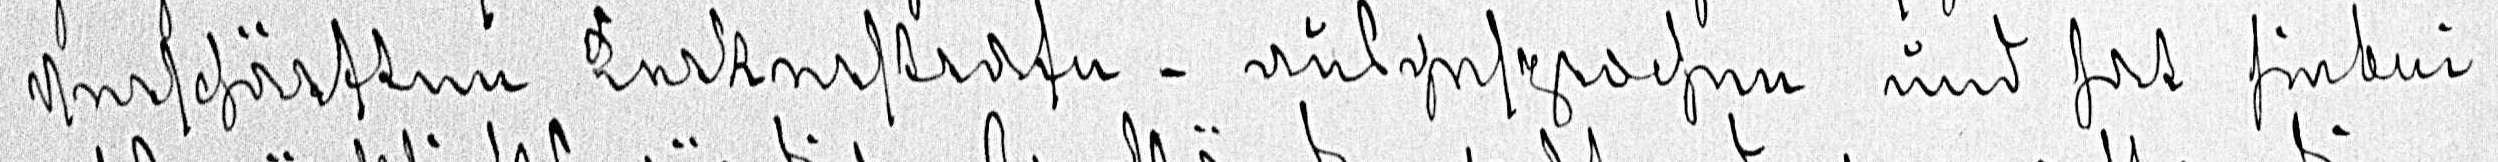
verschärften Kerkerstrafe – ausgesprochen und hat hiebei
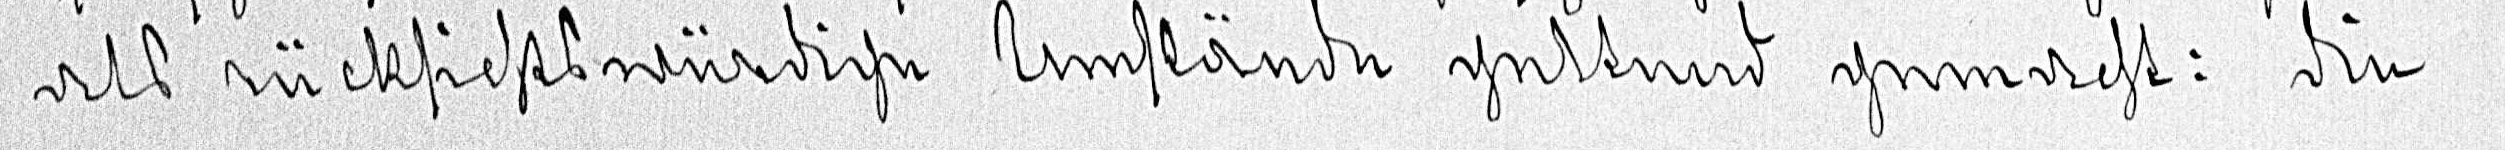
als rücksichtswürdige Umstände geltend gemacht: die
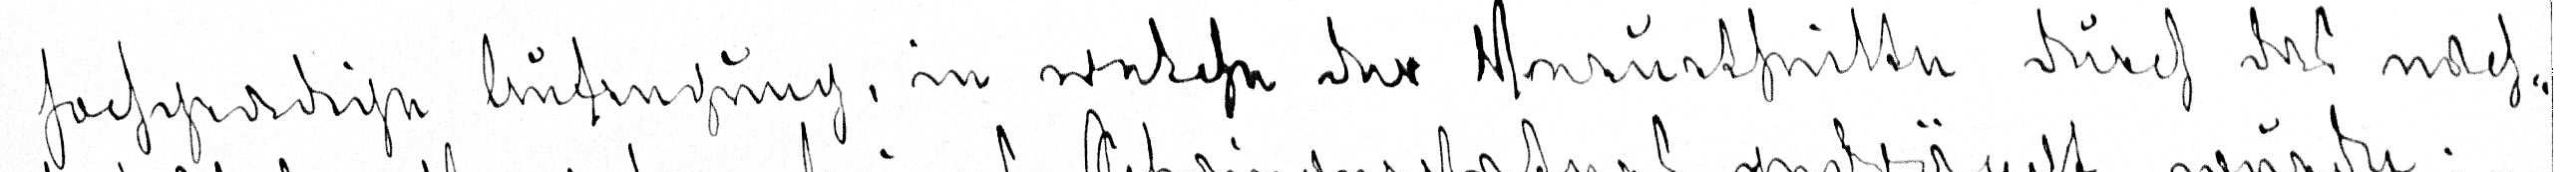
hochgradige Aufregung, in welche der Verurtheilte durch das nach¬
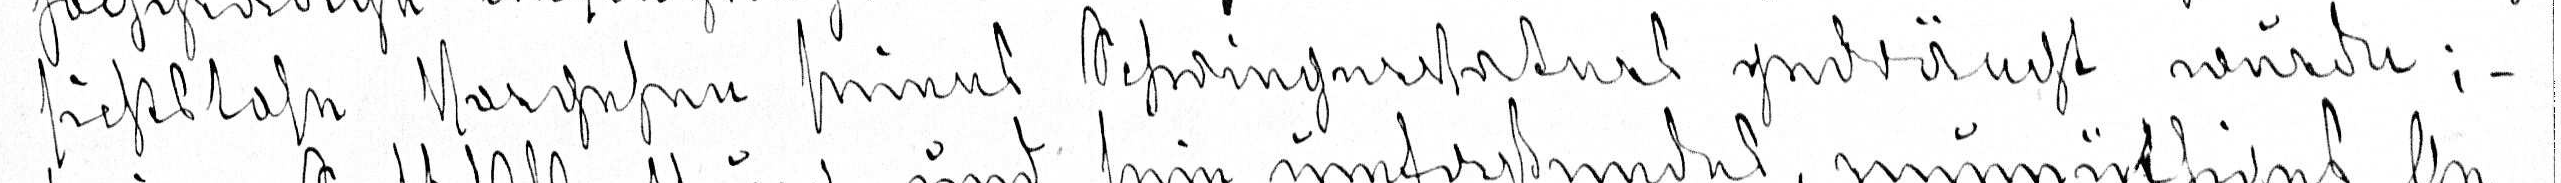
sichtslose Vorgehen seines Schwiegervaters gedrängt wurde;
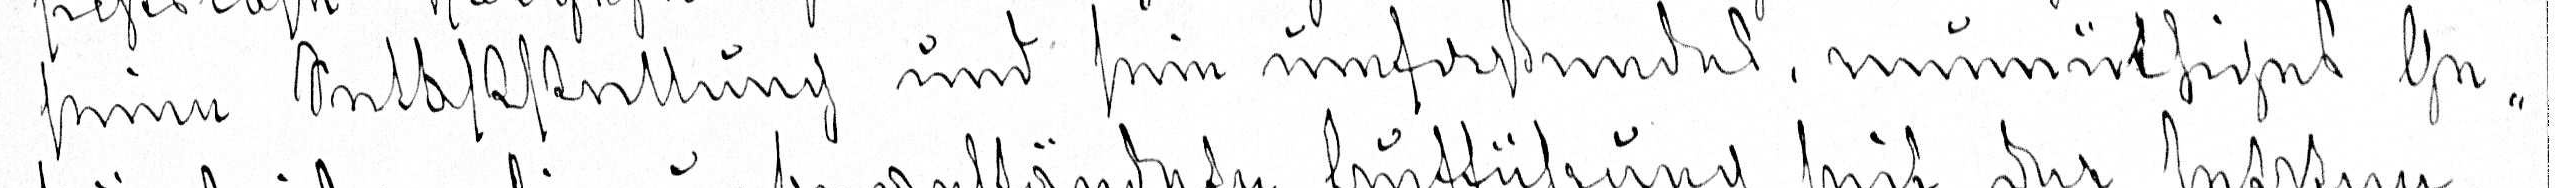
seine Selbststellung und sein umfaßendes, reumüthiges Ge¬
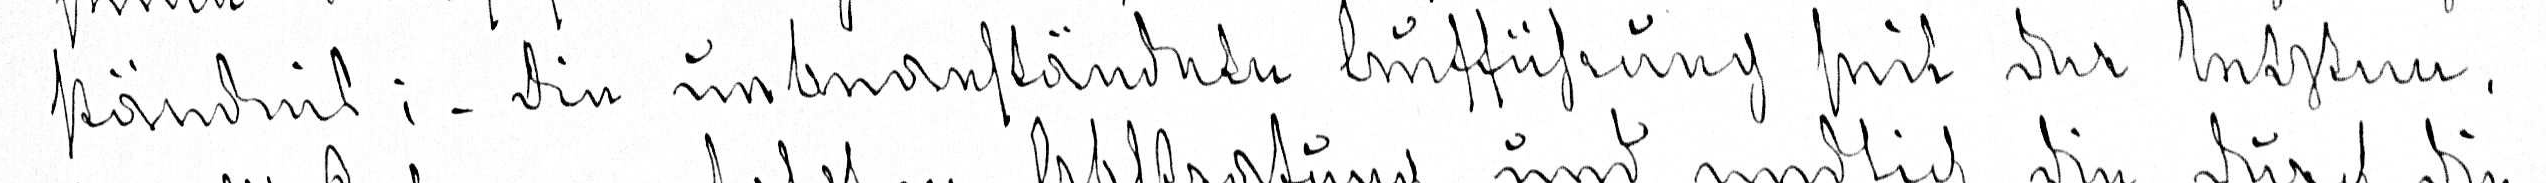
ständnis; die unbeanständete Aufführung seit der letzten,
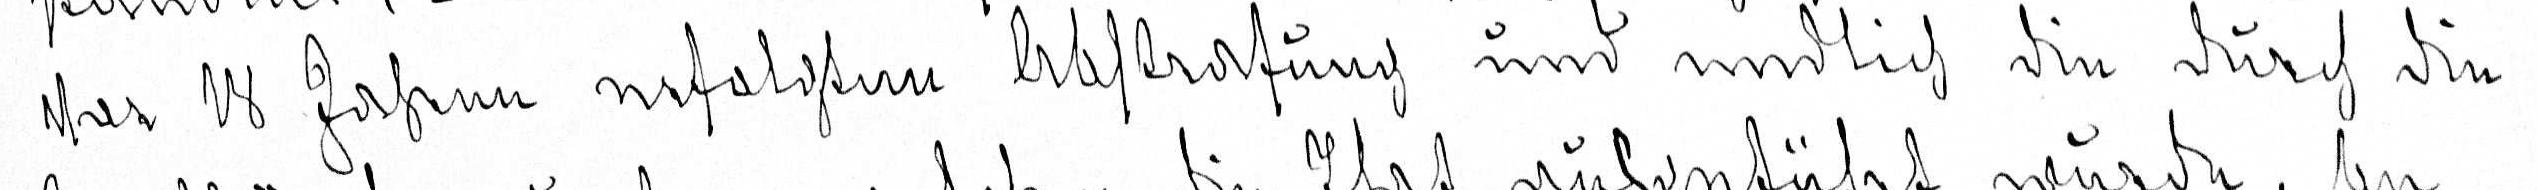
vor 18 Jahren erfolgten Abstrafung und endlich die durch die
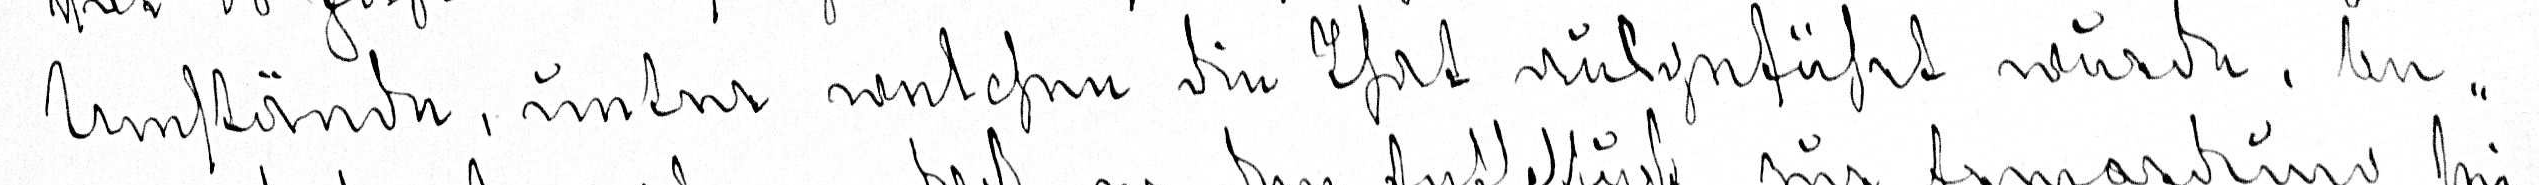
Umstände, unter welchen die That ausgeführt wurde, be¬
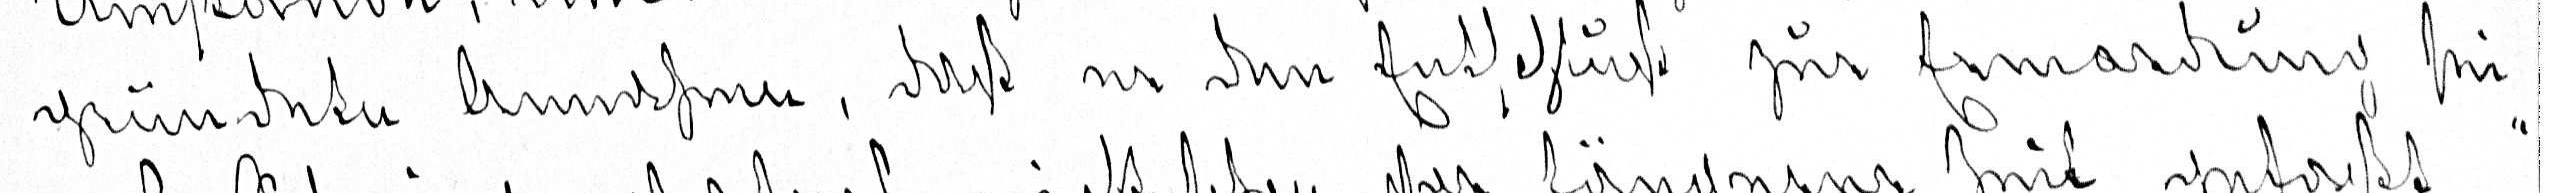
gründete Annahme, daß er den Entschluß zur Ermordung sei¬
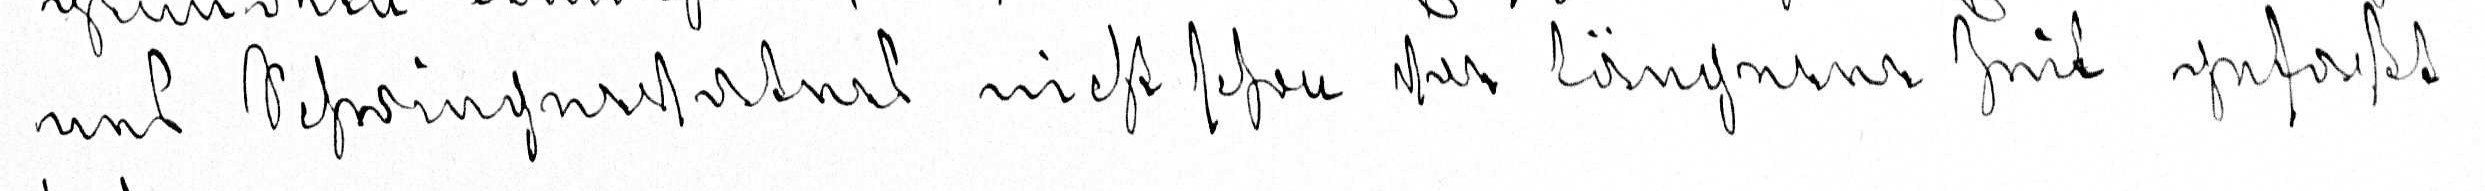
nes Schwiegervaters nicht schon vor längerer Zeit gefaßt
